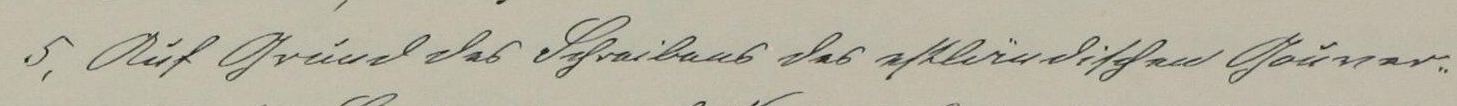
5. Auf Grund des Schreibens des estländischen Gouver-
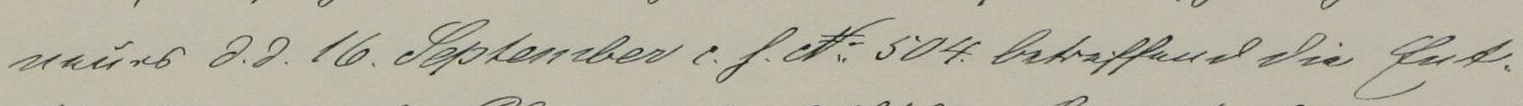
neurs d.d. 16. September c. s. No. 504. betreffend die Ent-
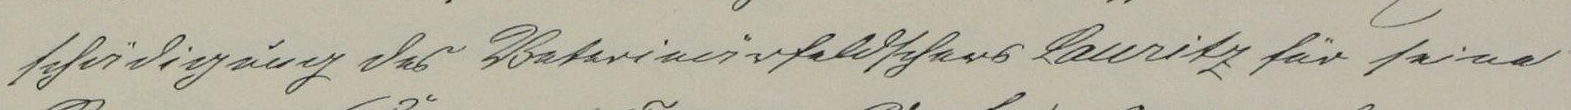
schädigung des Veterinärfeldschers Lauritz für seine
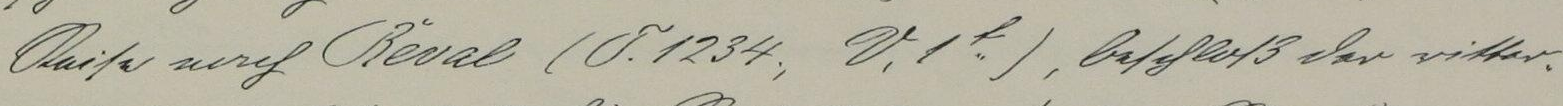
Reise nach Reval (T.1234; V.1f) beschloß der ritter-
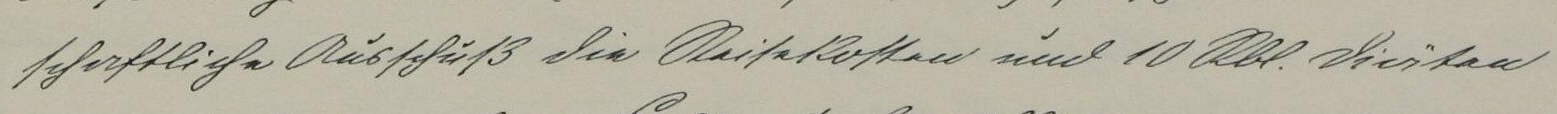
schaftliche Ausschuß die Reisekosten und 10 Rbl. Diäten
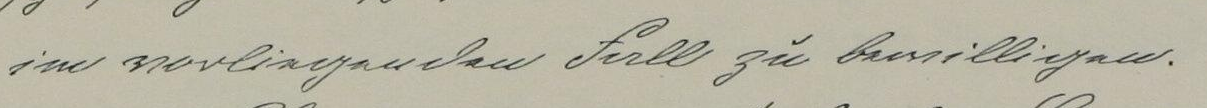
im vorliegenden Fall zu bewilligen.
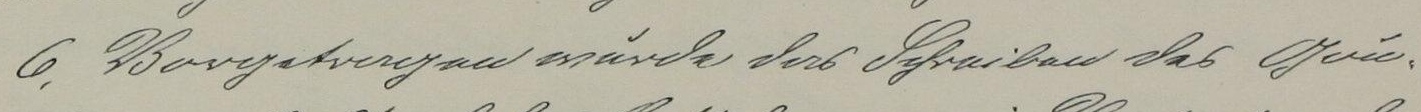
6. Vorgetragen wurde das Schreiben des Gou-
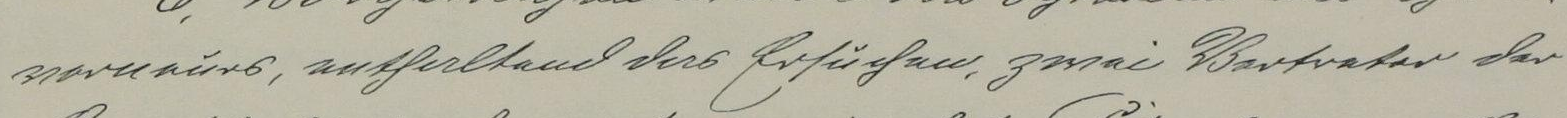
verneurs, enthaltend das Ersuchen, zwei Vertreter der
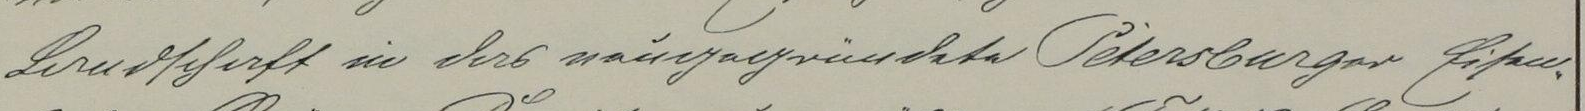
Landschaft in das neugegründete Petersburger Eisen-
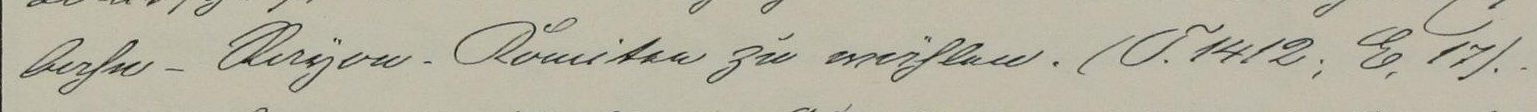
bahn-Rayon-Komitee zu wählen (T.1412; E.17).
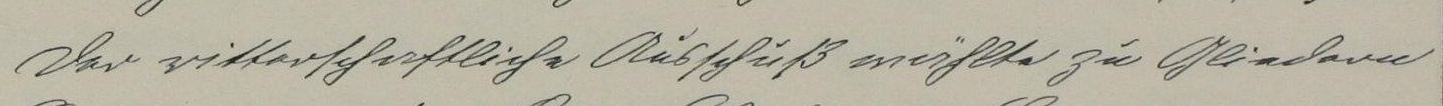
Der ritterschaftliche Ausschuß wählte zu Gliedern
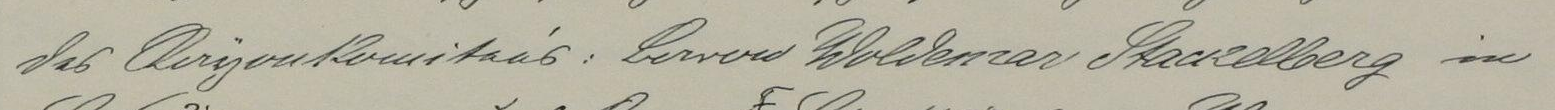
des Rayonkomitees: Baron Woldemar Stackelberg in
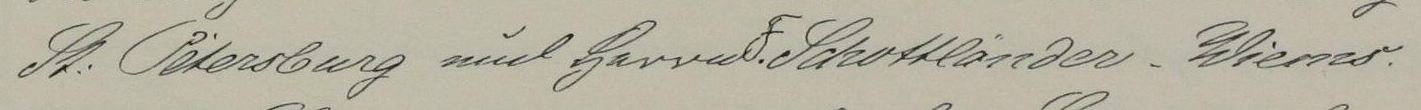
St. Petersburg und Herrn F. Schottländer-Wiems.
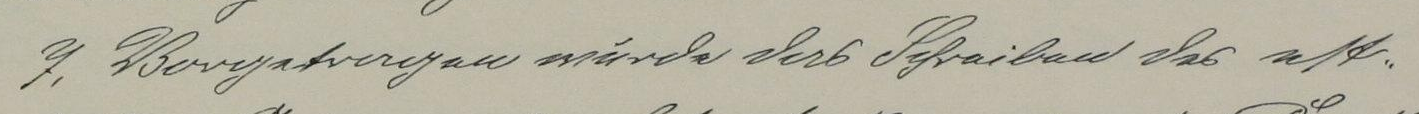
7. Vorgetragen wurde das Schreiben des est-
